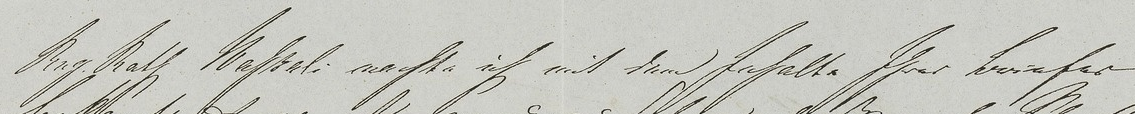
Reg.Rath Vassali machte ich mit dem Inhalte Ihres Briefes
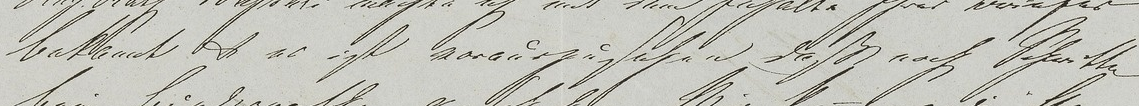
bekannt & es ist vorauszusehen, daß noch Schritte
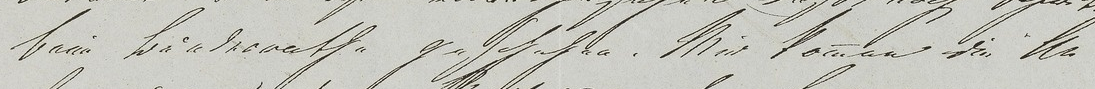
beim Bundesrathe geschehen. Mir kommen die An-
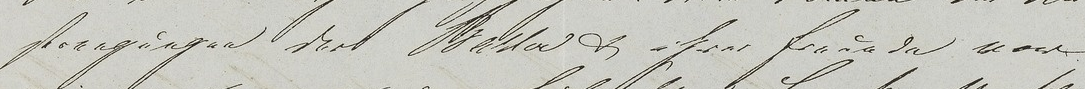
strengungen der Balla & ihrer Freunde vor
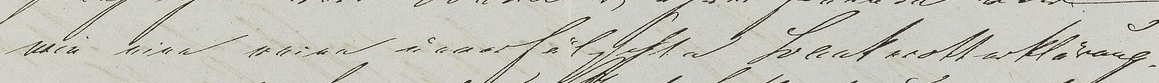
wie eine reine unverfälschte Bankrotterklärung.
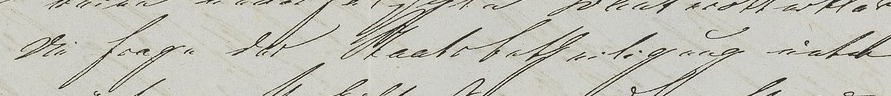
Die Frage der Staatsbetheiligung unter
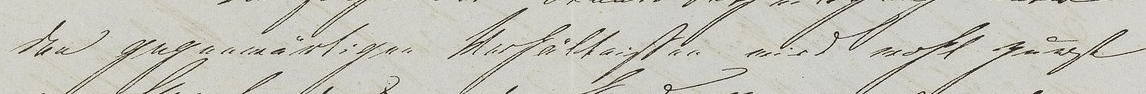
den gegenwärtigen Verhältnissen wird wohl zuerst
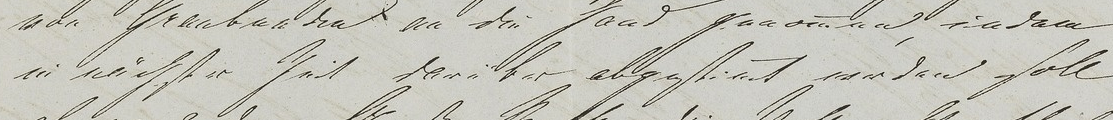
in nächster Zeit darüber abgestimmt werden soll,
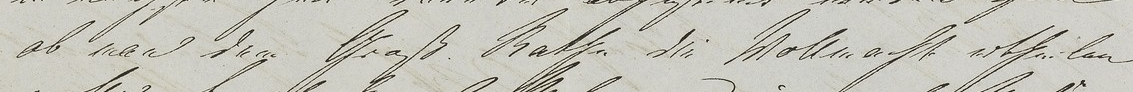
ob man dem Groß. Rathe die Vollmacht ertheilen
